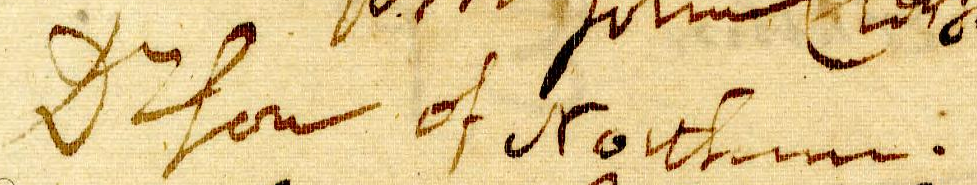D^r sir of Northum-
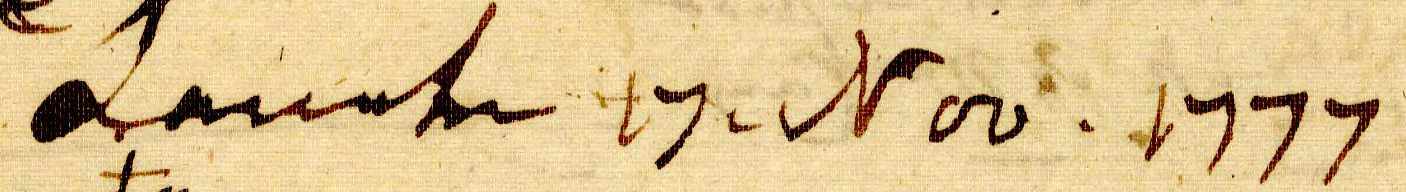Lancaster 17. Nov. 1777
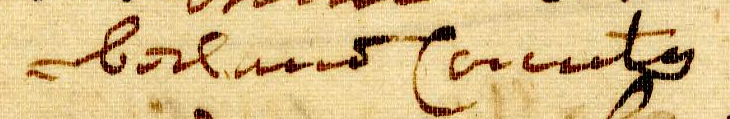-berland County
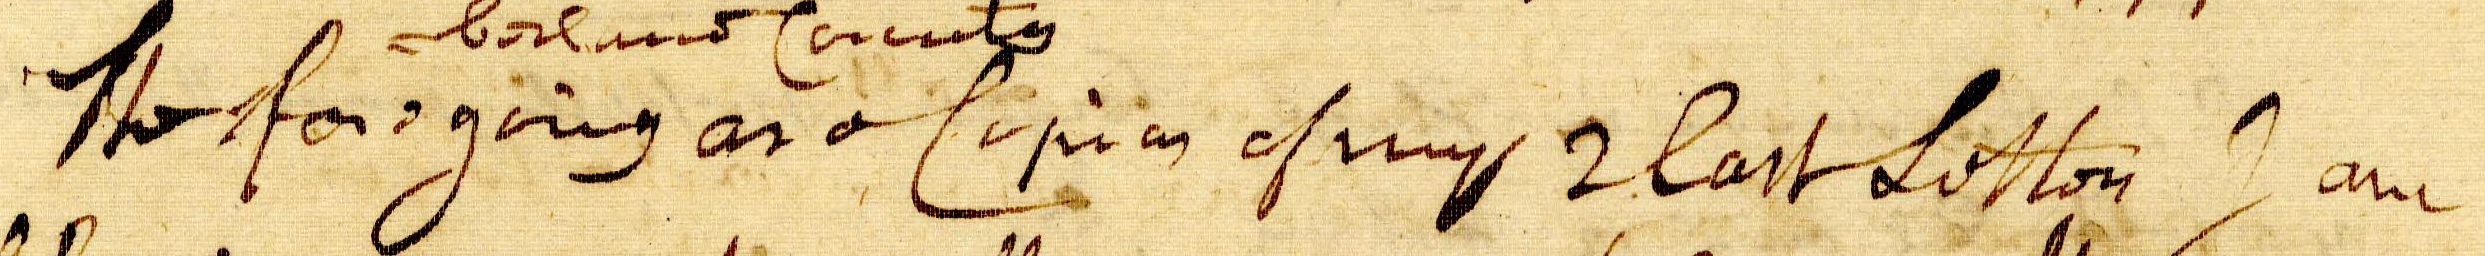The foregoing as a Copias of my 2 last Letters I am
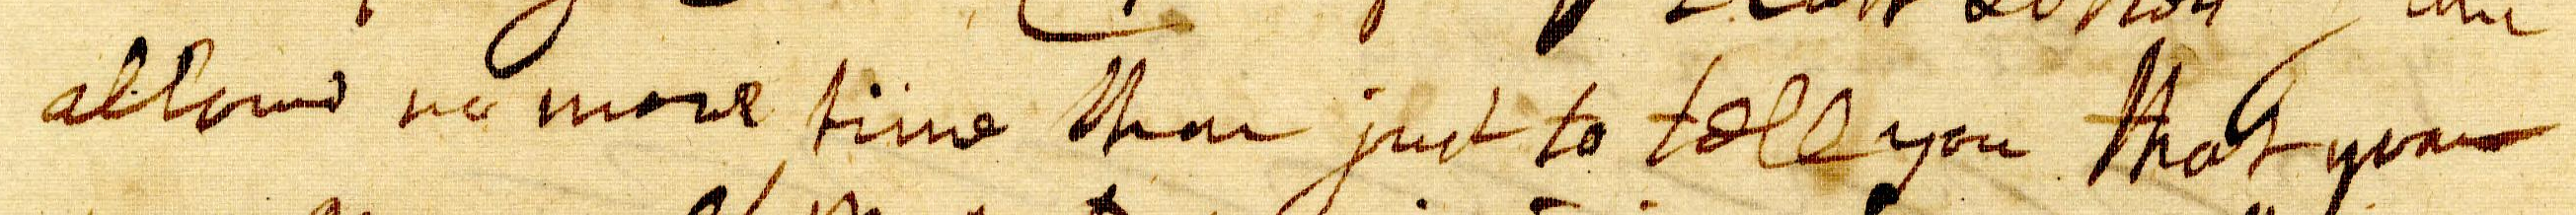allowd no more time than just to tell you that your
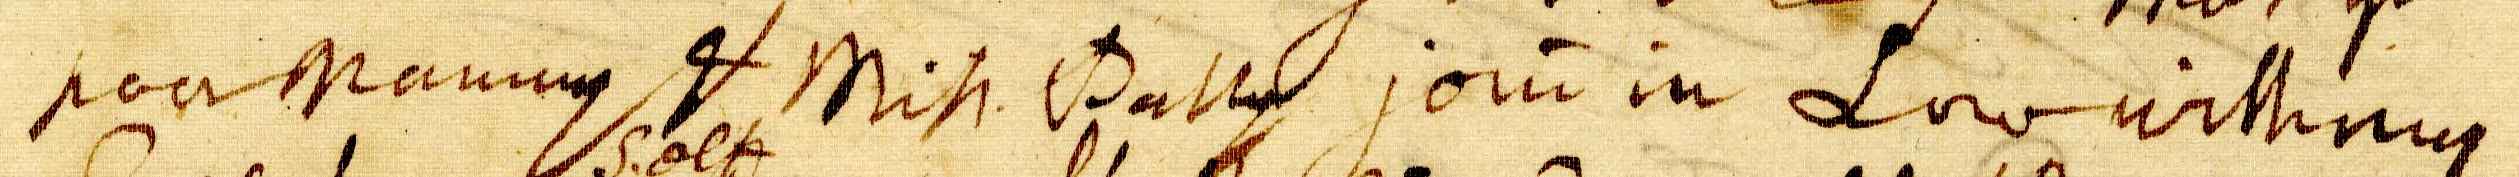poor mammy & Miss Patty join in Lowe with my
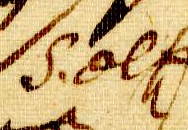self
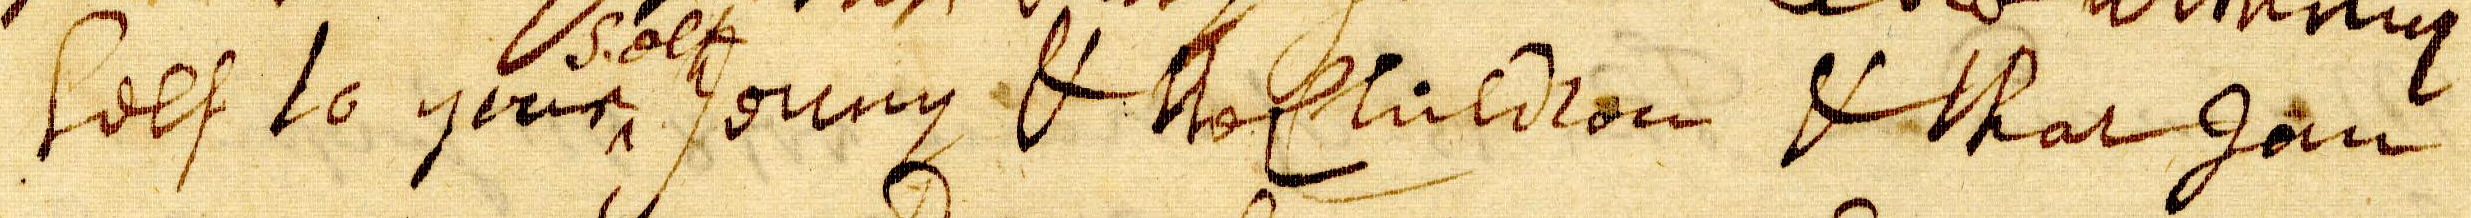self to your ^ Jenny & the Children & that I am
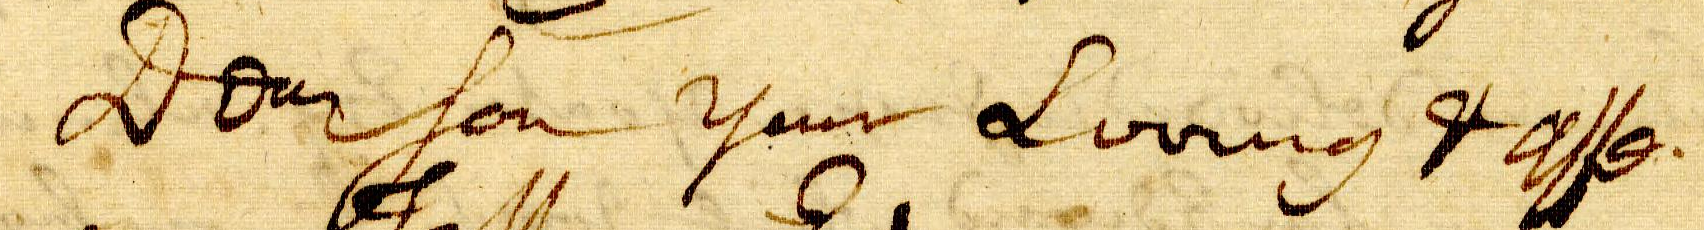Dear son your Loving & affe.
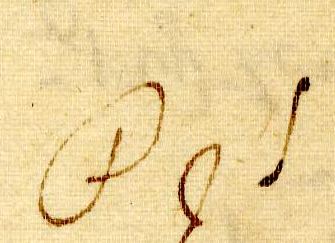PS
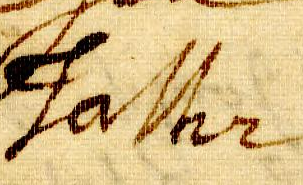Father
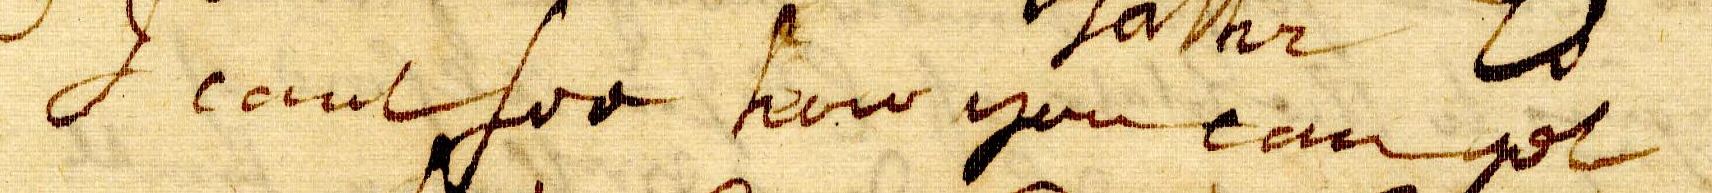I cant see how you can get
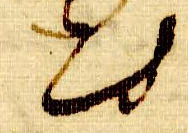ES
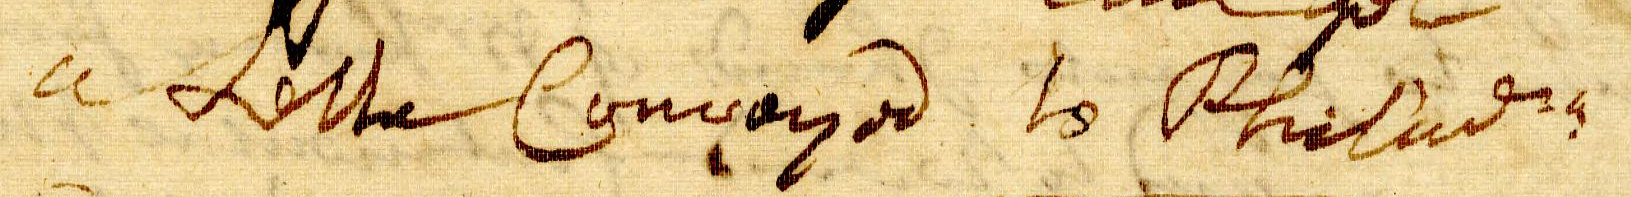a Letter Conveyed to Philad^a.
